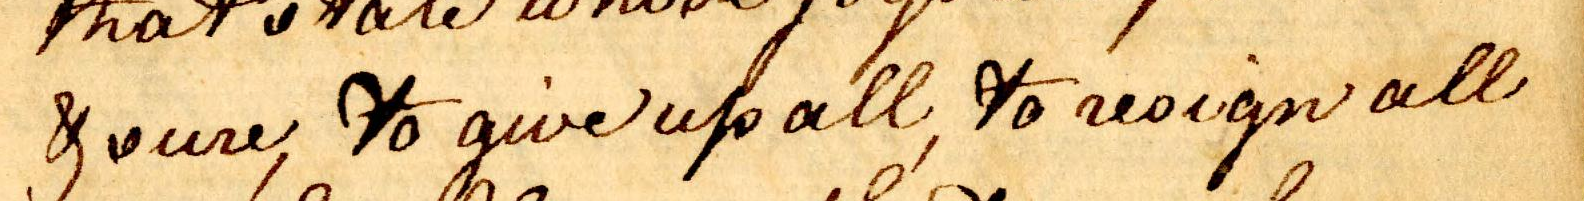& sure, to give up all to resign all
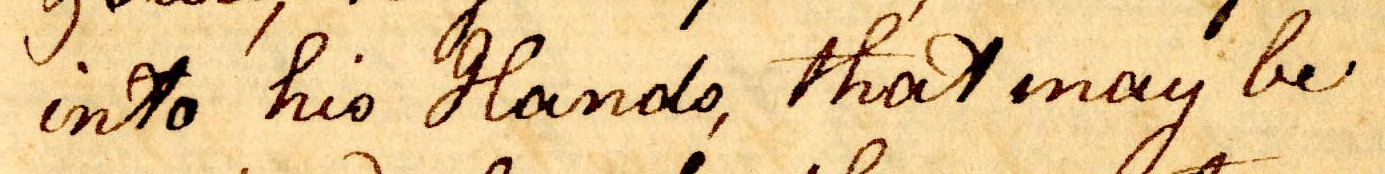into his Hands, that may be
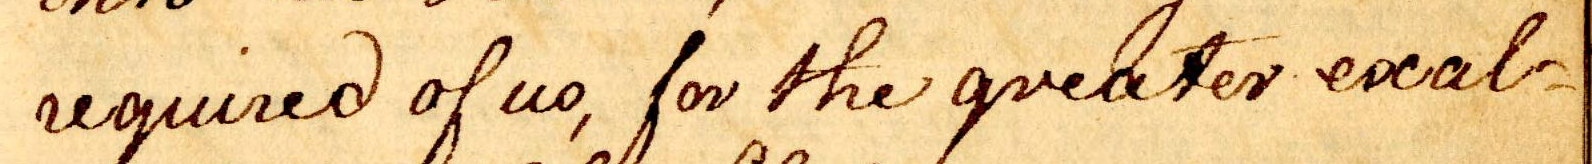required of us for the greater exal-
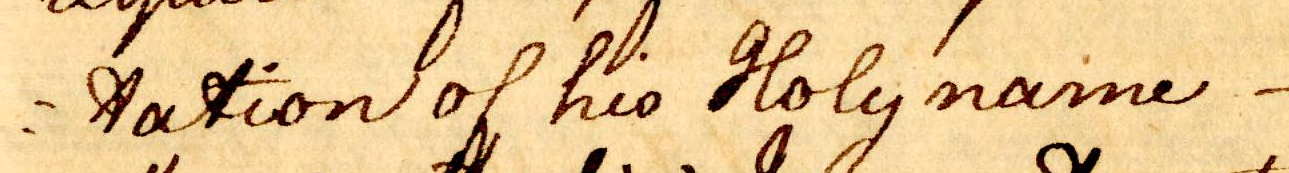-tation of his Holy name-
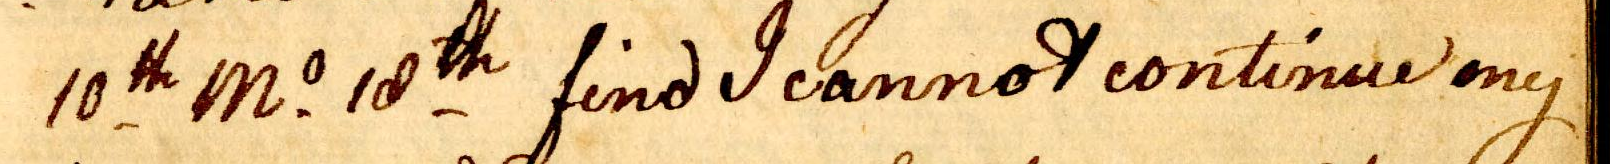10^th M^o 18^th find I cannot continue my
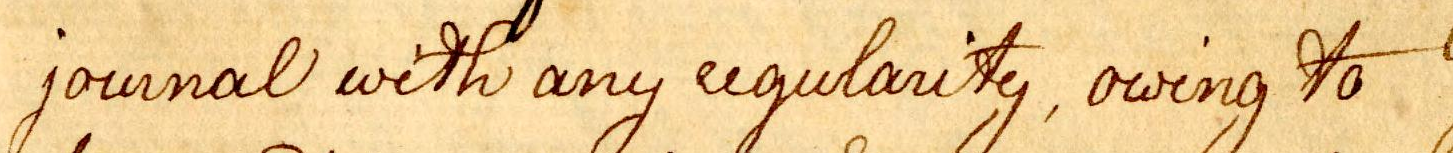journal with any regularity, owing to
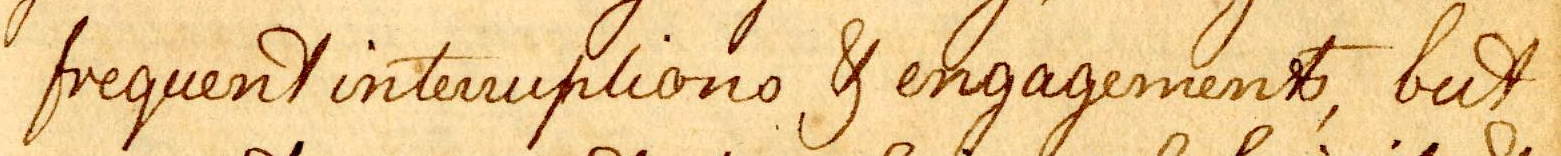frequent interruptions & engagements, but
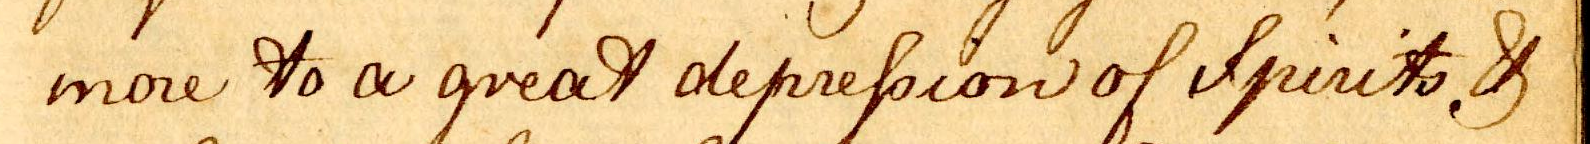more to a great depression of Spirits &
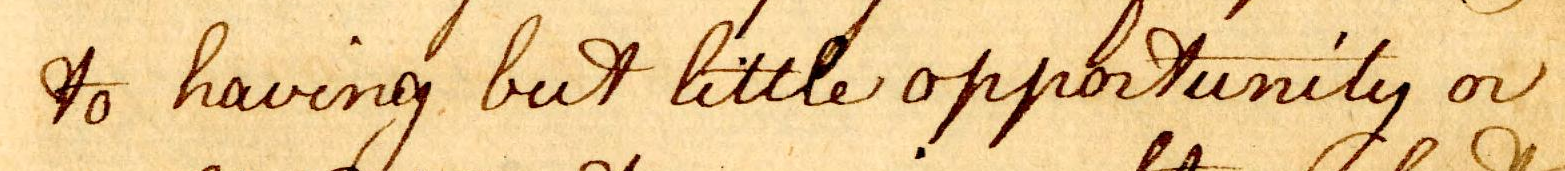to having but little opportunity or
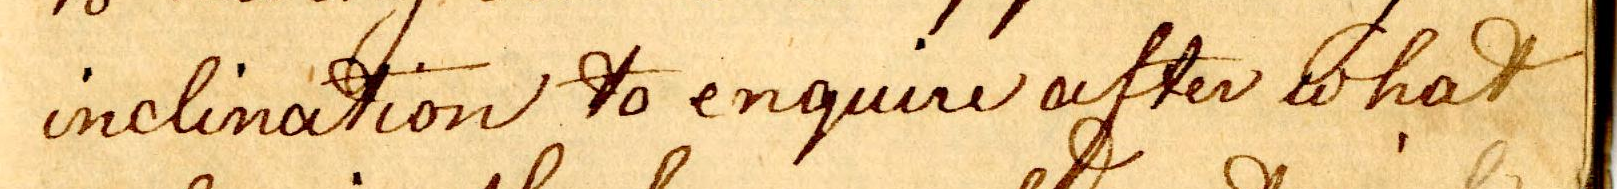inclination to enquire after what
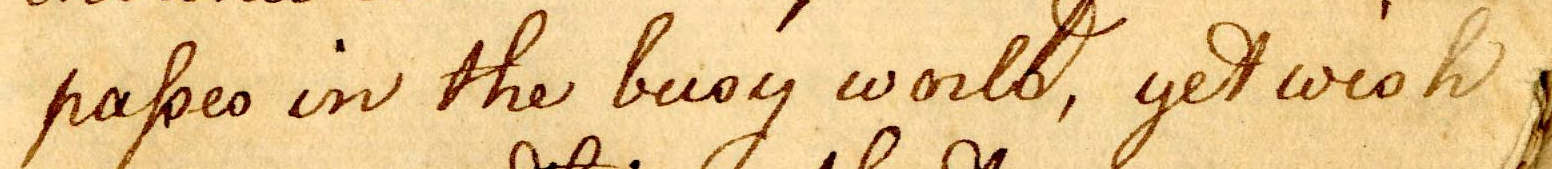passes in the busy world, yet wish
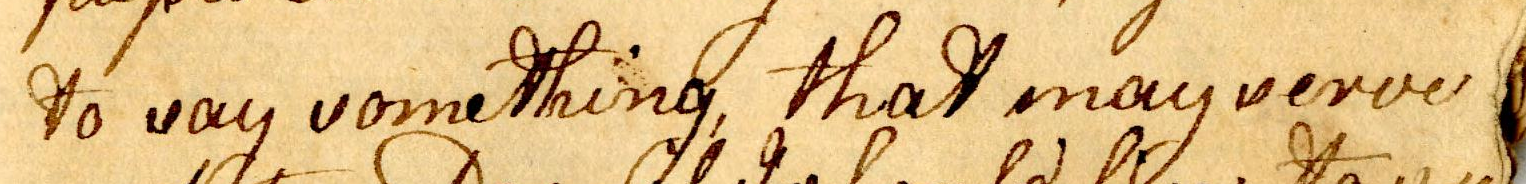to say something, that may serve
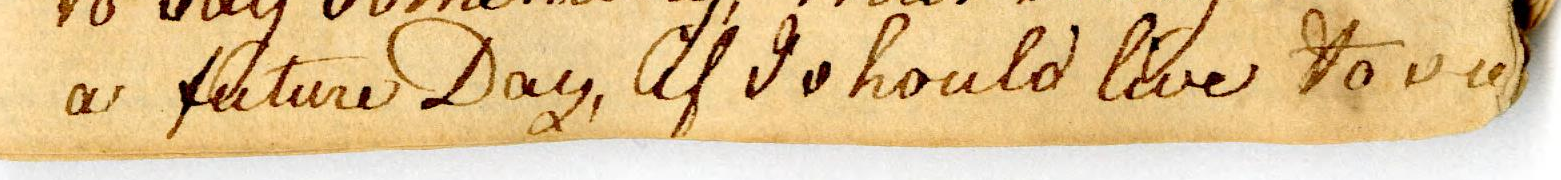a future Day, if I should live to see
